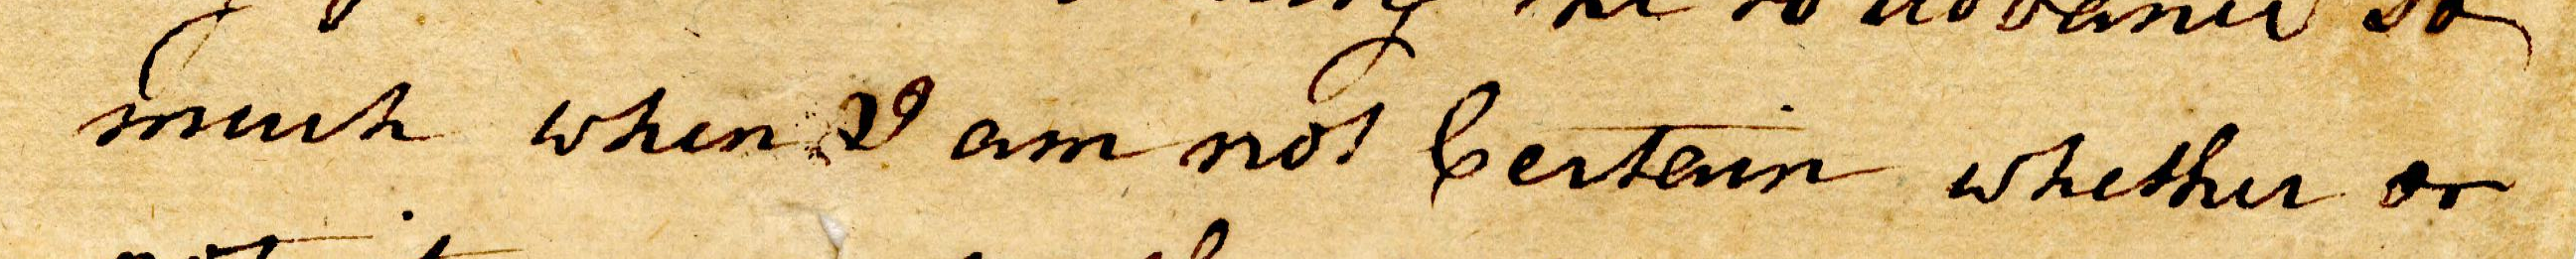much when I am not Certain whether or
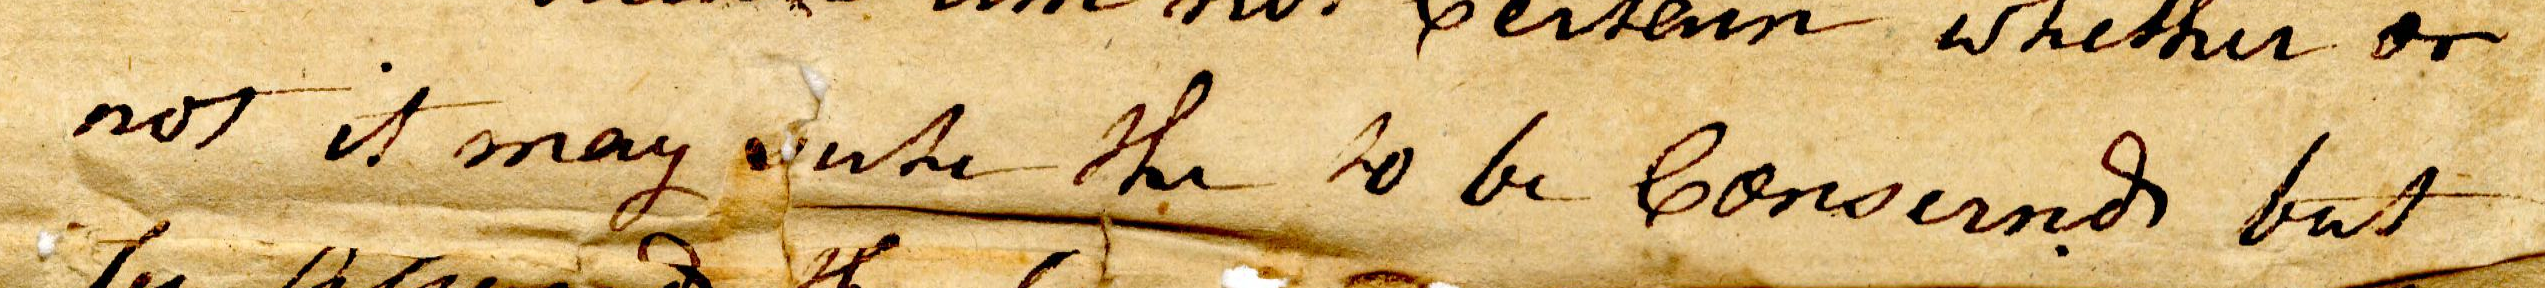not it may sute the to be Consern'd but
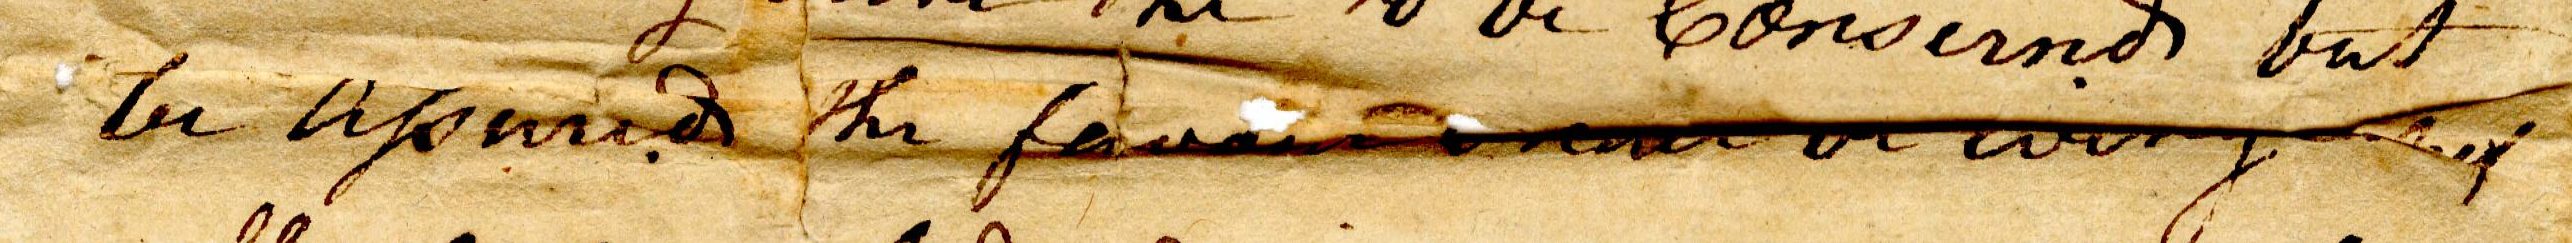be assured the favor [______________]
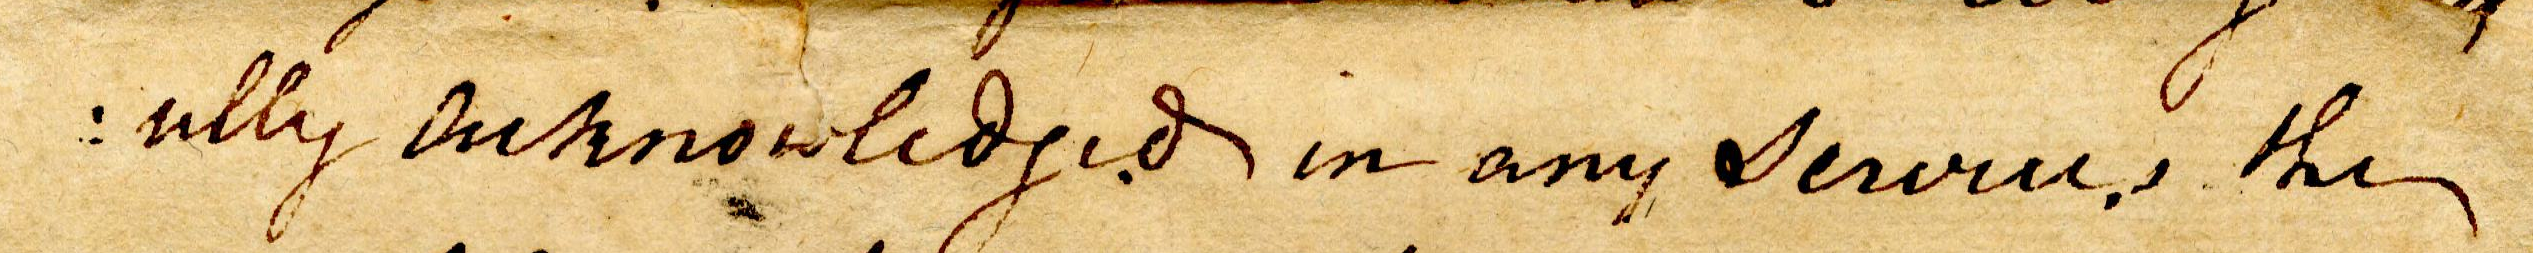-ully acknowledged in any services the
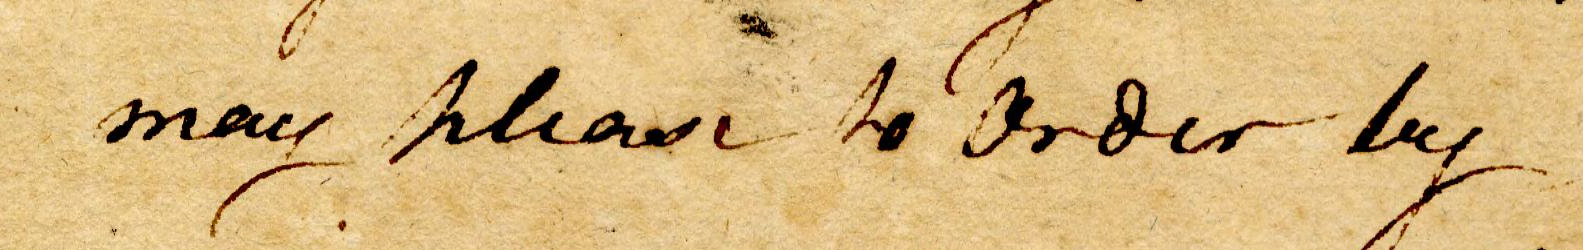may please to Order by
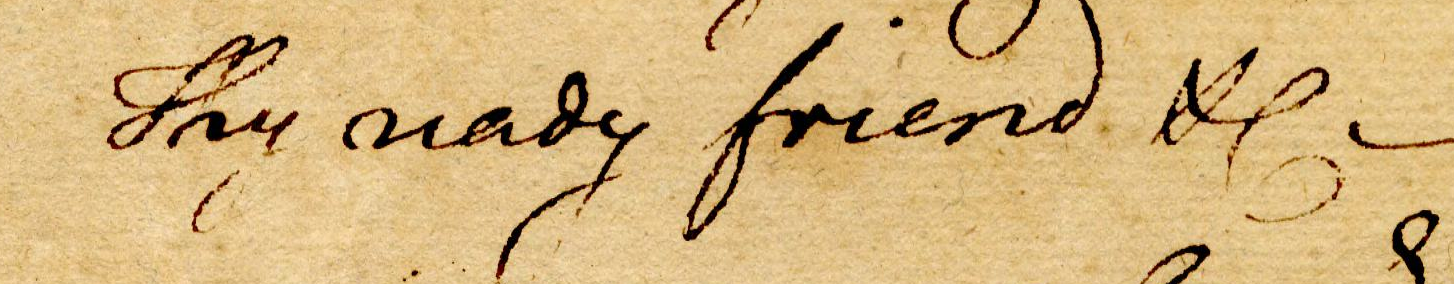Thy ready firned &c-
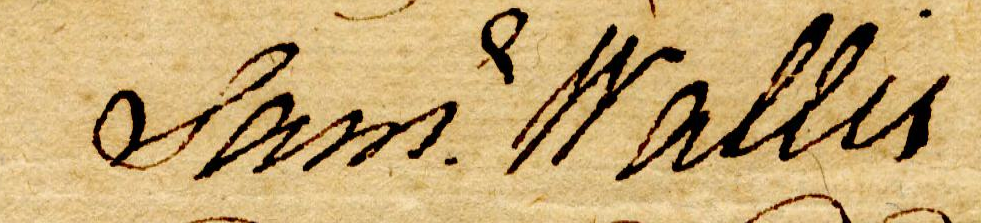Sam^l. Wallis
